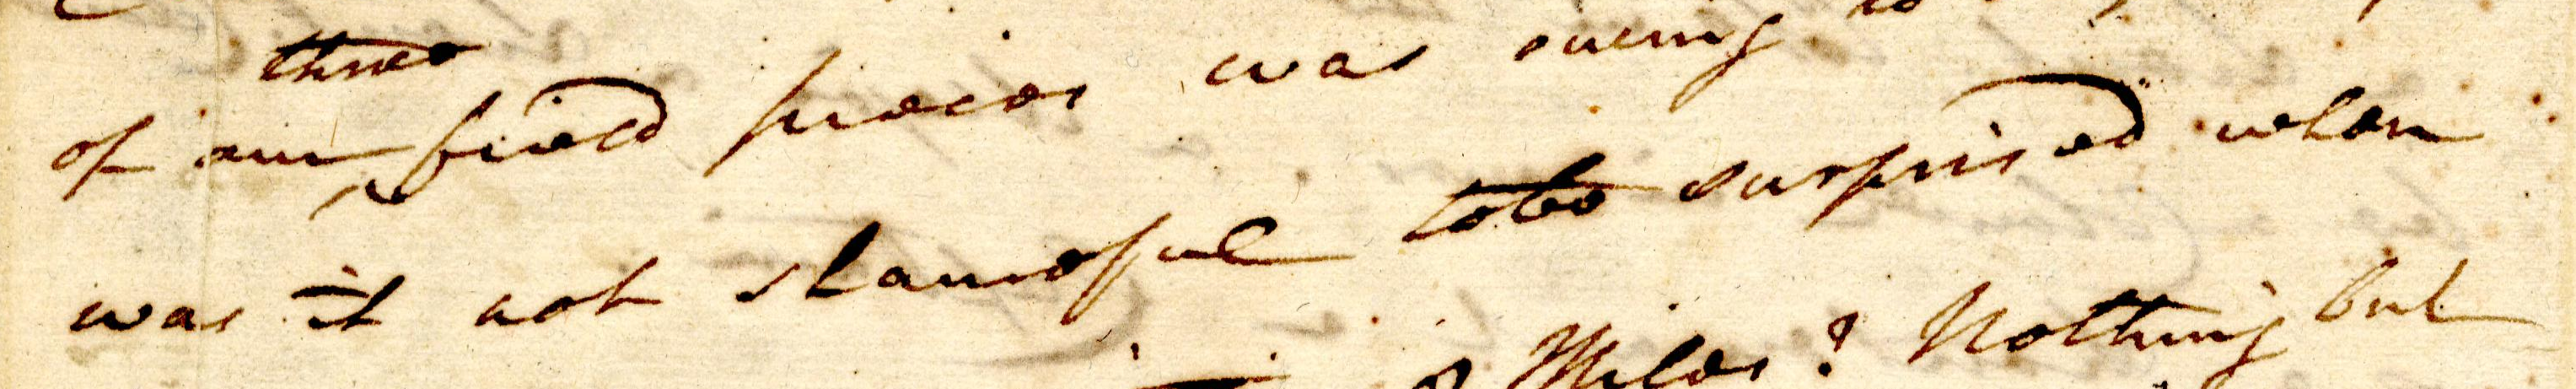was it not shameful to go surprised when
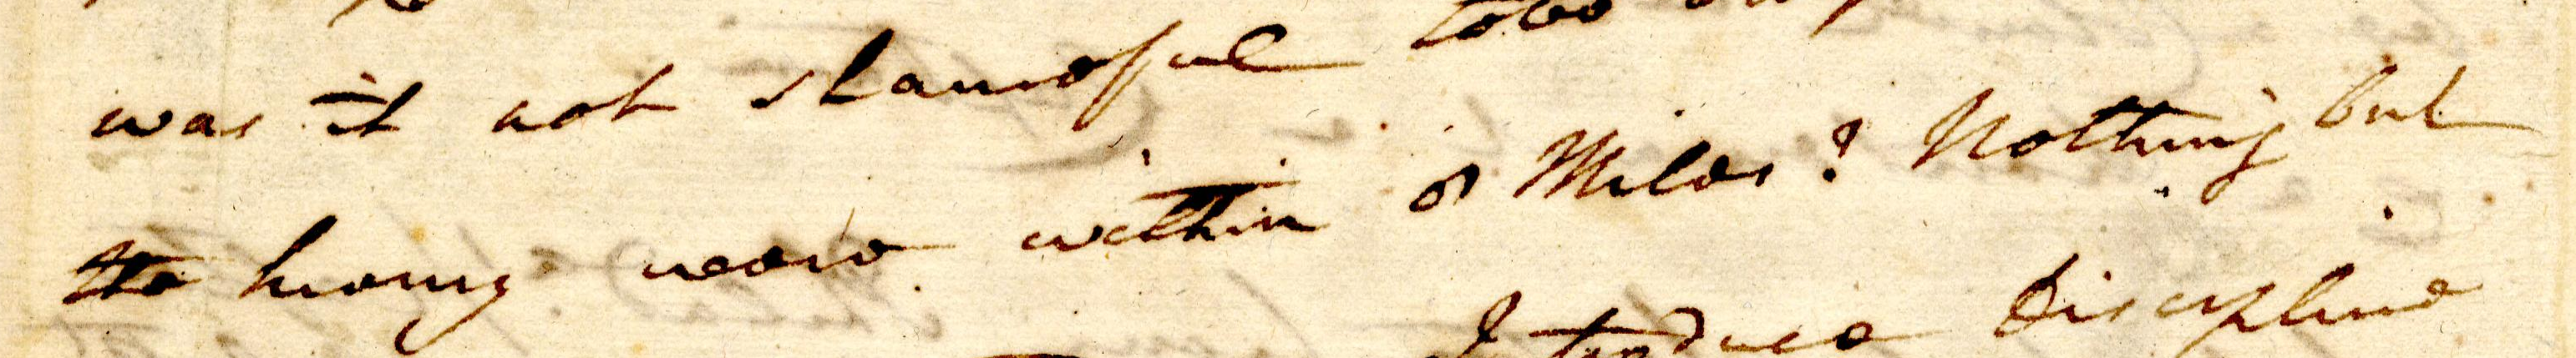tho havig cause within 8 Miles? Nothing but
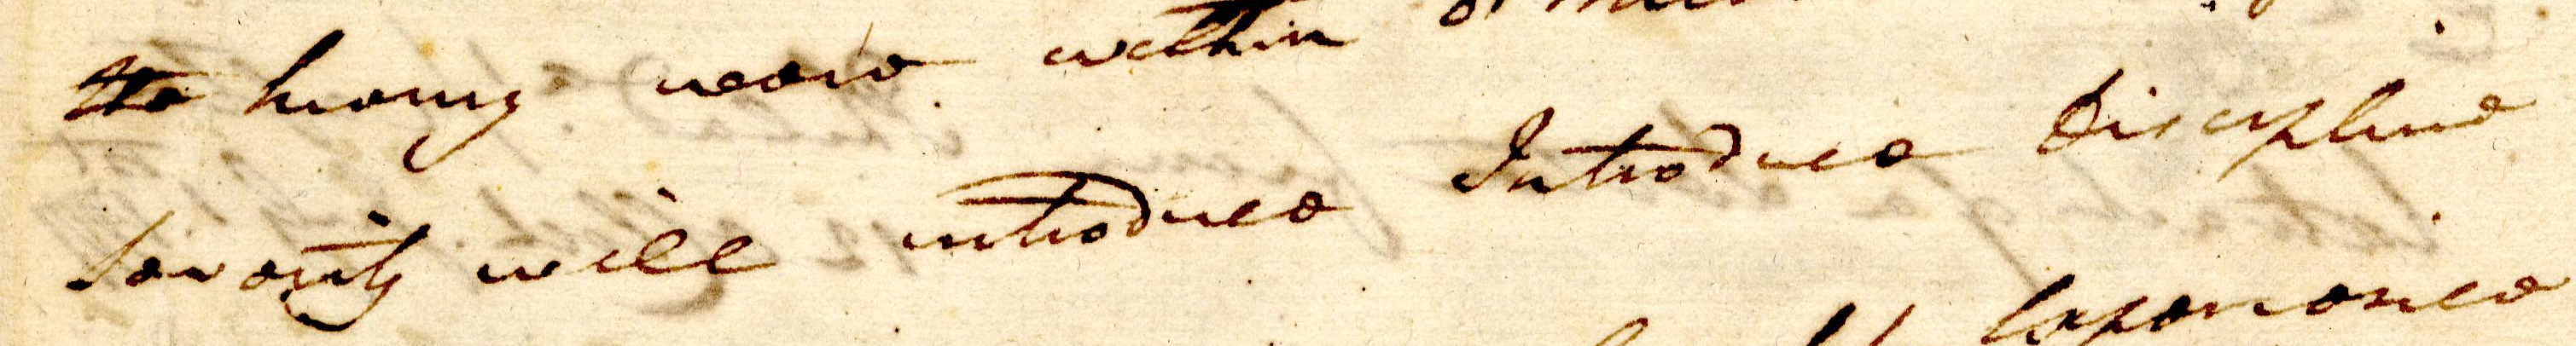Senority will introduce Introduce Discipline
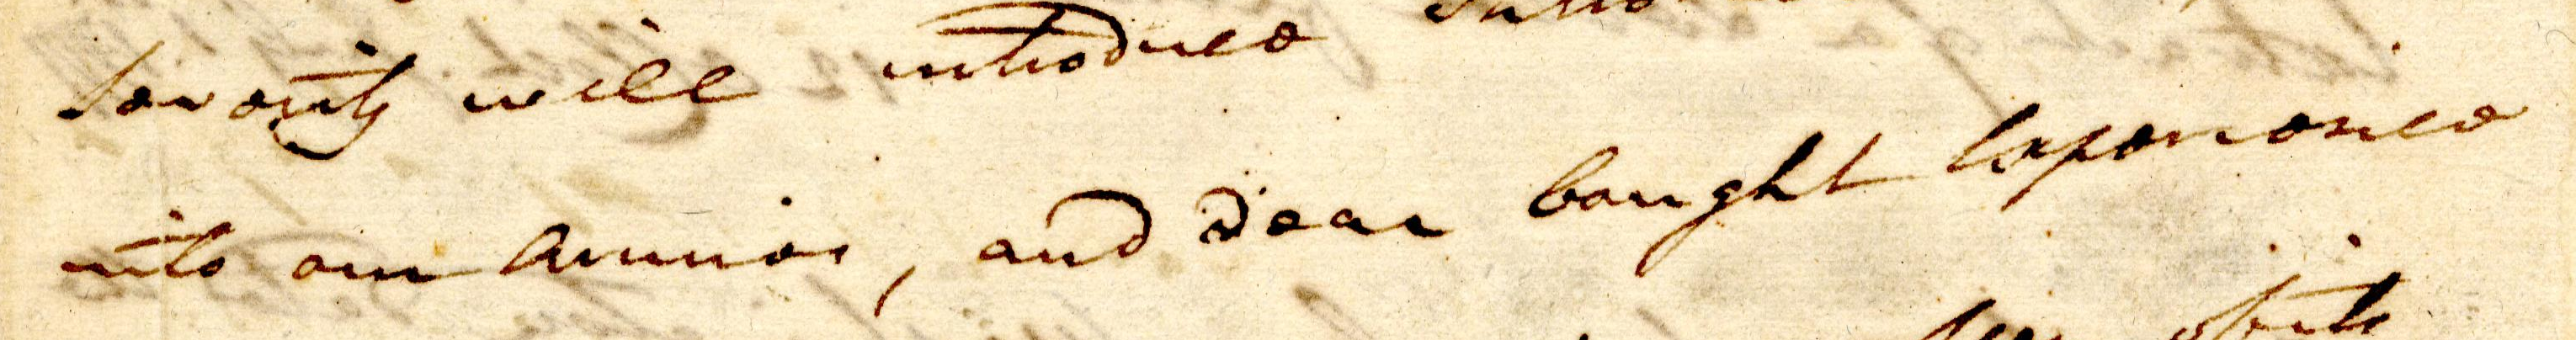into our armies, and dear bought experience
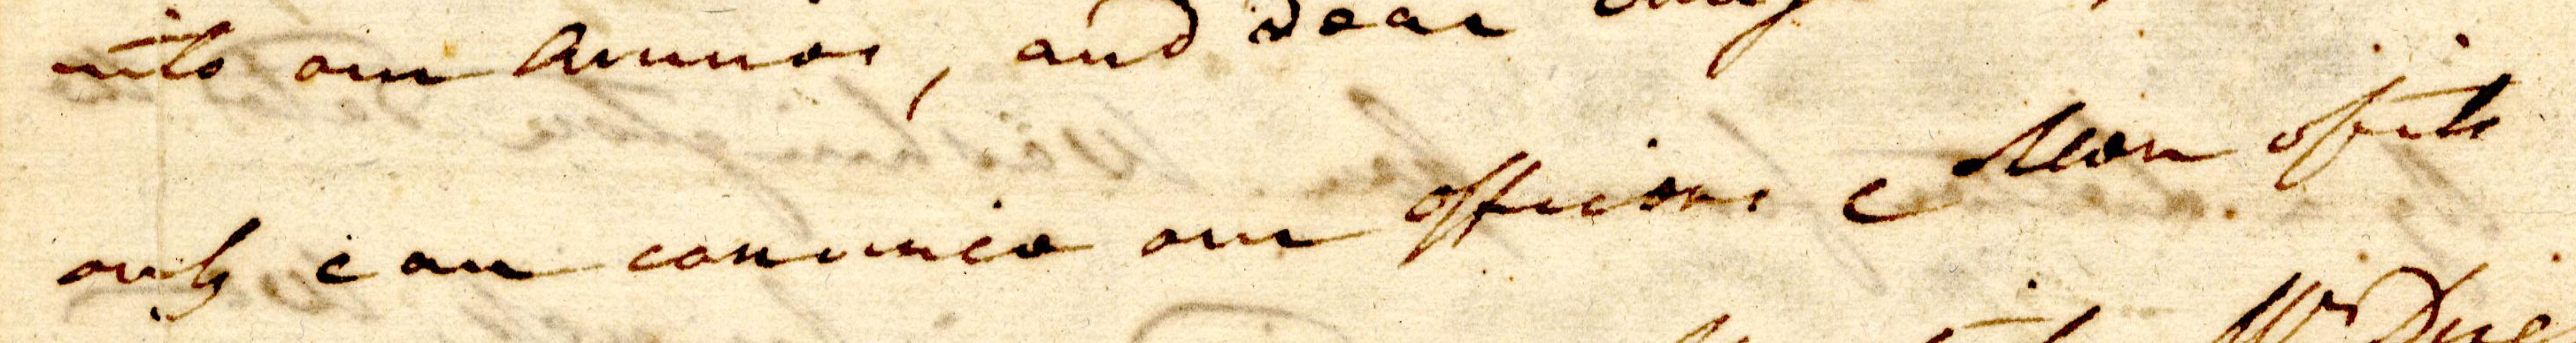only can convince our affections clean of its
